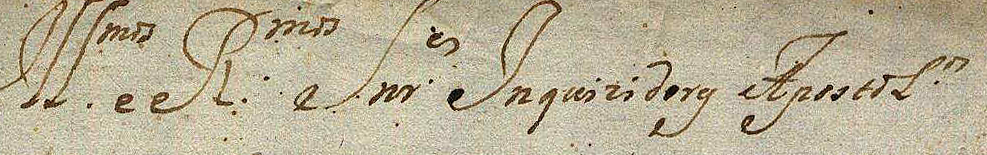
Ill.mos e R.mos Snr.es Inquizidores ApostoL.os
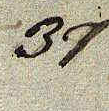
37
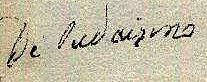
De Iudaismo
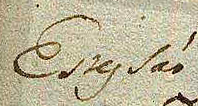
Estes saõ os
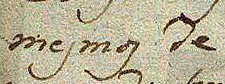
mesmos de
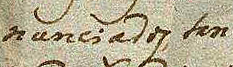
nunciados tan
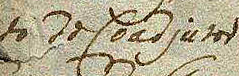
to do Coadjutor
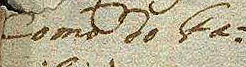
Como do Fa
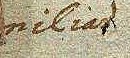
miliar
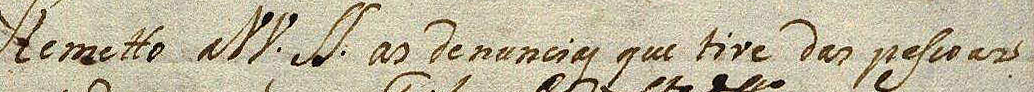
Remetto a VV. SS as denuncias que tive das pessoas
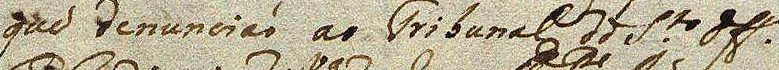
que denunciaõ ao Tribunal do S.to Off.o
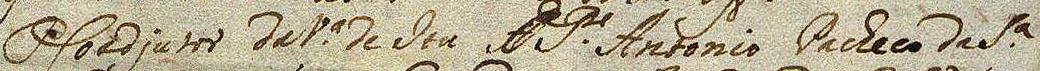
O Coadjutor da V.a de Itu O P.e Antonio Pacheco da S.a
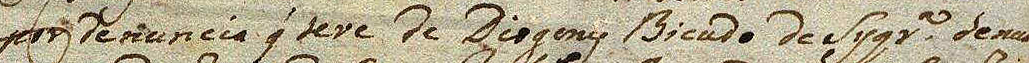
por denuncia q̄ teve de Diogenes Bicudo de Syqr.a denun
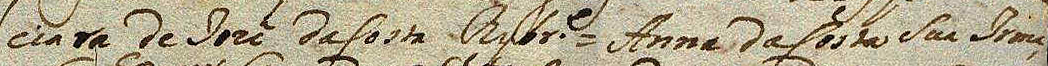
ciara de Iozé da Costa Rybr.o = Anna da Costa Sua Irma,
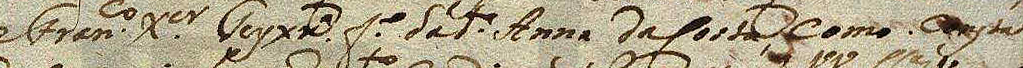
Fran.co X.er Teyxr.a f.o da d.a Anna da Costa, como. consta
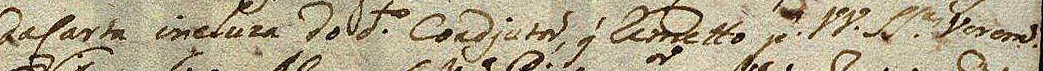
da Carta incluza do d̄.o Coadjutor, q̄ Remetto p. VV. SS.as Verem
